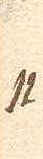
11
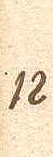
12
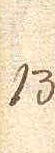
13
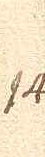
14
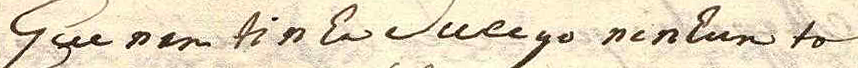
Que nam tinha sucego nenhun to
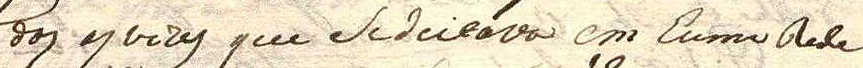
dos as vezes que se deitava em huma Rede
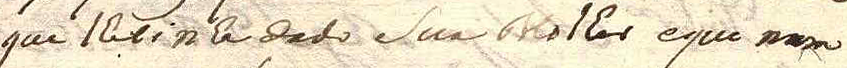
que lhe tinha dado sua Molher e que nam
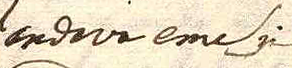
andava em sy
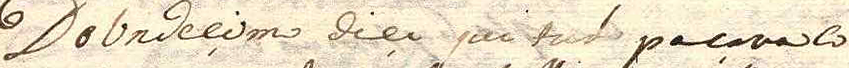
Do vndeçimo diçe que tudo paçava co
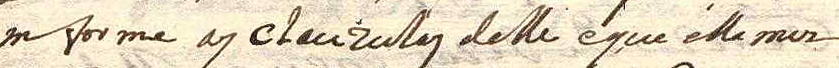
mforme as clauzulas delle e que ella mes
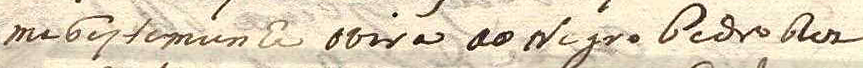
ma Testemunha ovira ao Negro Pedro Rez
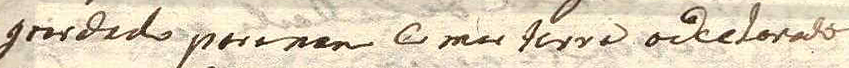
goardado para nan comer terra o declarado
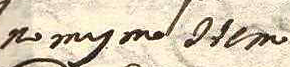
no mesmo Item
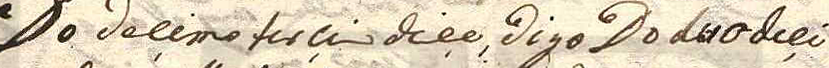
Do deçimoterçio diçe, digo Do duodeçi
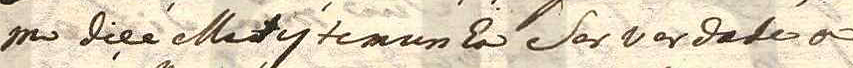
mo diçe elle testemunha ser verdade a
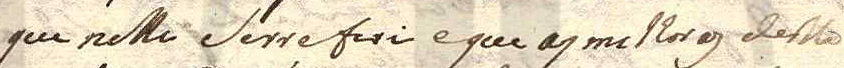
que nella se rreferi e que as melhoras de Ma
